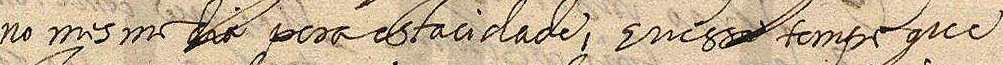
no mesmo dia pera esta cidade, E nesse tempo que
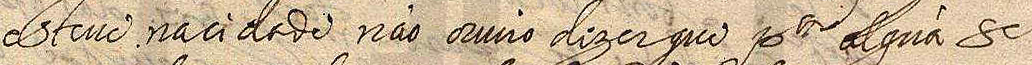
esteue na cidade não ouuio dizer que pa alguā se
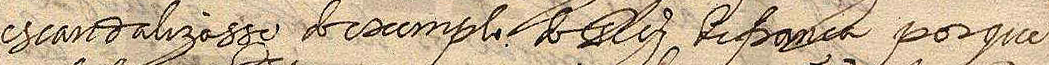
escandalizasse do exemplo do Rey de frança porque
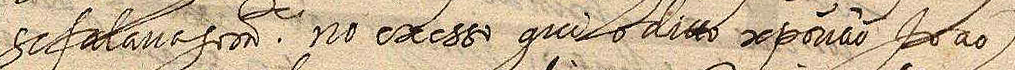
se falaua som.te no exesso que o ditto xpouão Joaõ
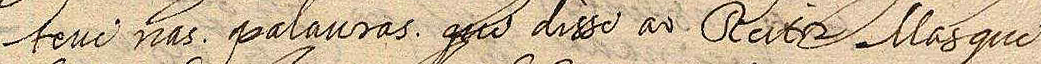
teue nas palauras. que disse ao Reitor Mas que
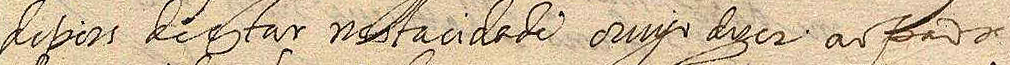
depois de estar nesta cidade ouuio dizer ao padre
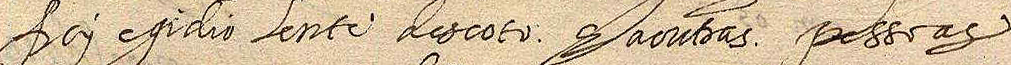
frey egidio Lente descoto E a outras pessoas
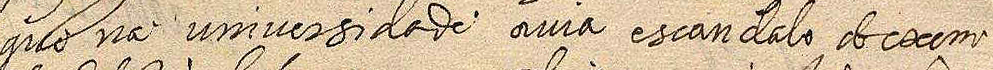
que na uniuersidade auia escandalo do exem
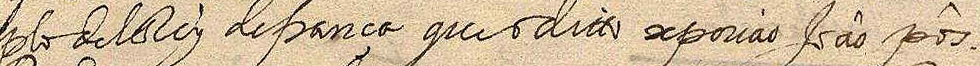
plo del Rey de frança que o ditto xpouão João pôs.
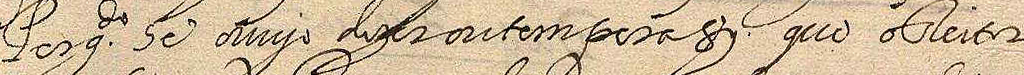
Perg.do se ouujo dizer ou tem pera sy que o Reitor
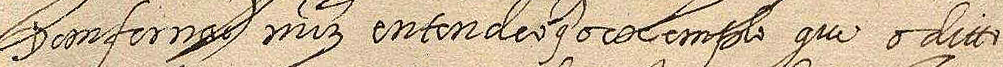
Dom fernaõ mīz entendeo q̄ o exemplo que o ditto
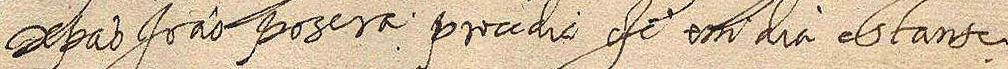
xpaõ João posera procedia oJe em dia estante
